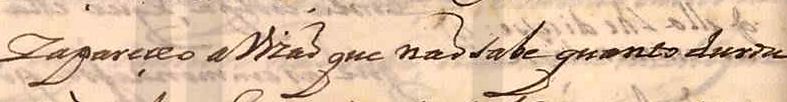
zapareceo a Vizaõ que naõ sabe quanto durou
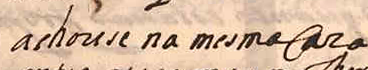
achou se na mesma Caza
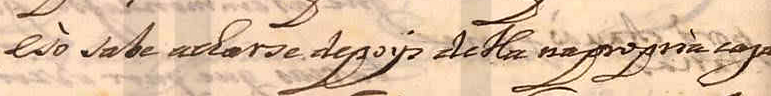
e sò sabe acharse depoys della na propria caza
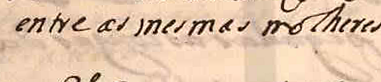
entre as mesmas molheres
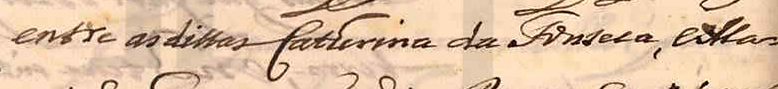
entre as dittas Catherina da Fonseca, e Ma
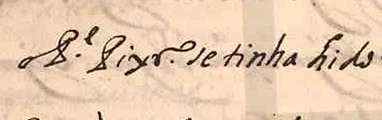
o P.e Pixr.o se tinha hido
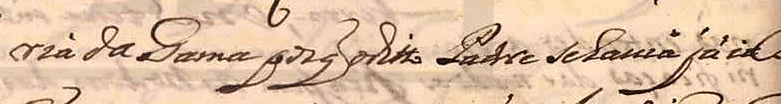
ria da Gama porq̄ o ditto Padre se hauia já ido
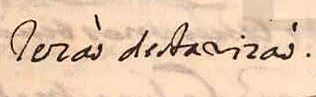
Rezaõ desta vizaõ.
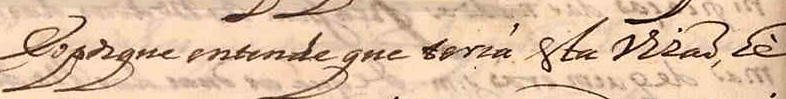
E o por que entende que teria esta Vizaõ, hé
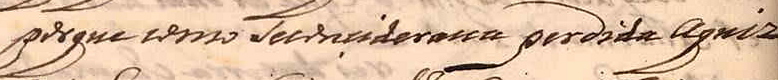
porque como se concideraua perdida a quiz
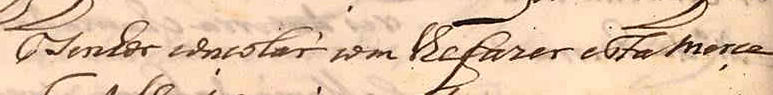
o Senhor conçolar com lhe fazer esta merce
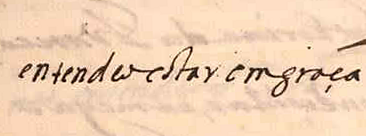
entendeo estar em graça
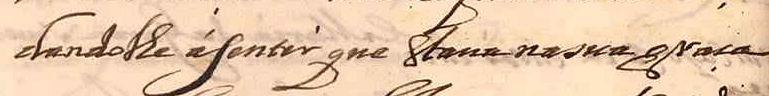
dandolhe á sentir que estaua na sua graça
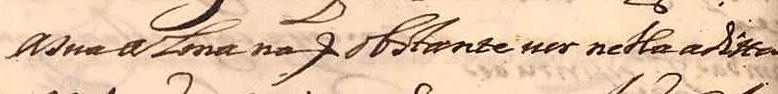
a sua alma naõ obstante uer nella a ditta
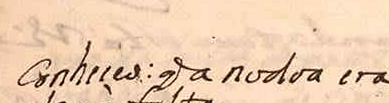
Conheceo: q̄ a nodoa era
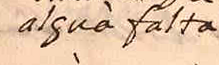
alguā falta
